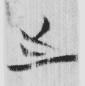之
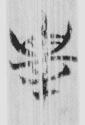辠
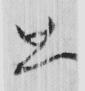也
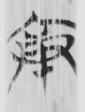{亯京}
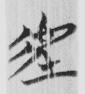𫊟
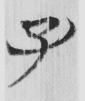子
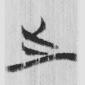之
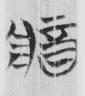𨟻
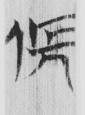倀
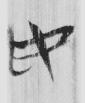女
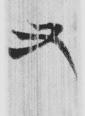又
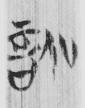訛
